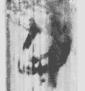㠯（以）
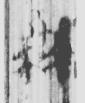{冉廿}
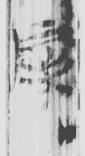厚
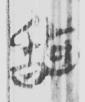䎽
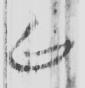㠯（以）
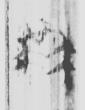{冉廿}
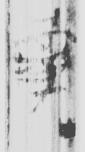章
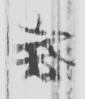者
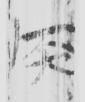侯
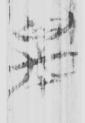萬
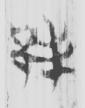邦
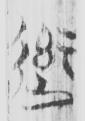{行糸止}
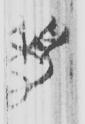嘉
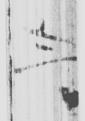之
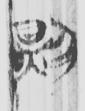則
